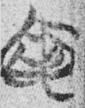龜
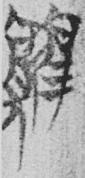觀
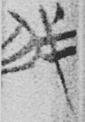我
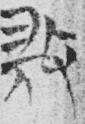{𡵂攴}（微）
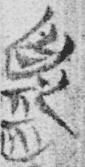頤
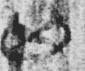凶
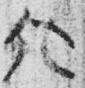六
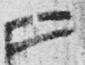二
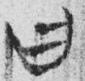曰
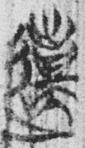○（顛）
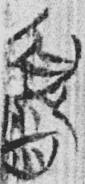頤
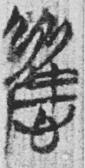○（弗）
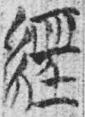經
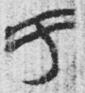于
